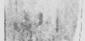廿
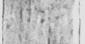三
